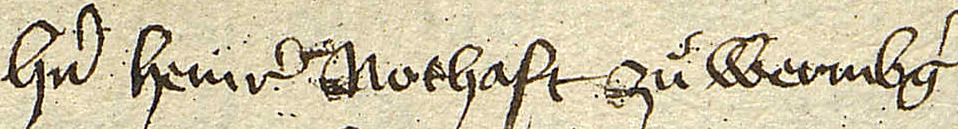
hn* heinr* Nothaft cʒü Wermbg*
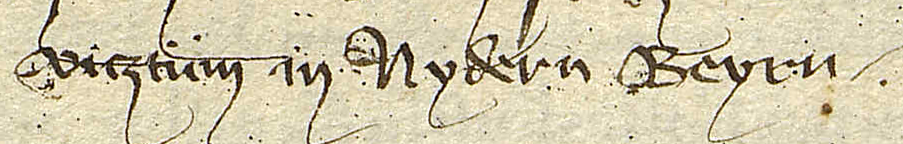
vicʒtüm in Nydern Beyrn / .
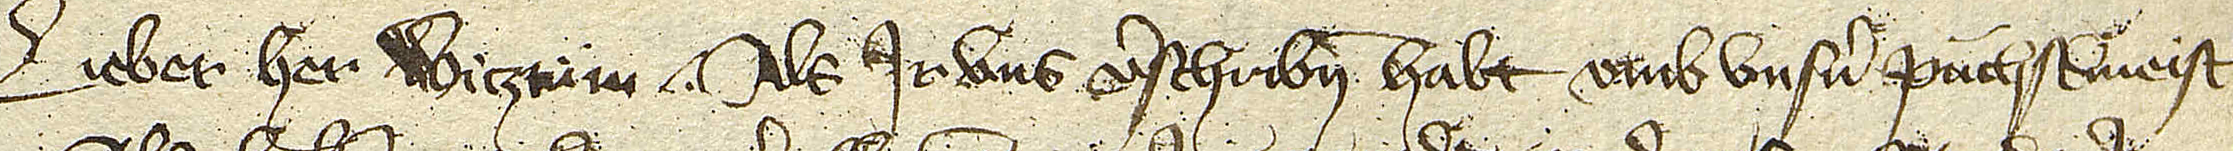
Lieber her Vicʒtüm / Als Ir vns v*ſchribn* habt vmb vnſn* püchſe*meiſt*
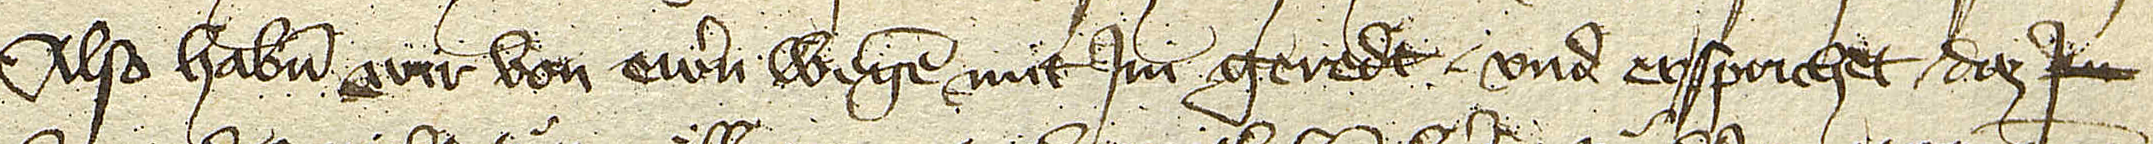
Alſo habn* wir von ew*n wege* mit Im geredt / vnd erſprichet / daʒ Im
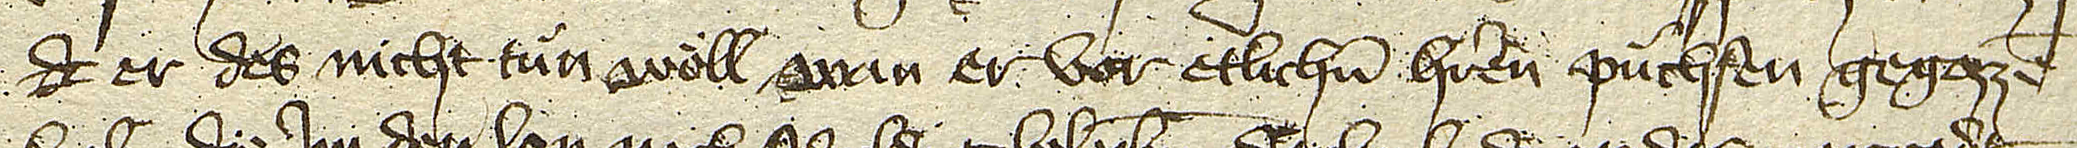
d er des nicht tun wöll / wan er vor etlichn* hr*en püchſen gegoʒʒe*
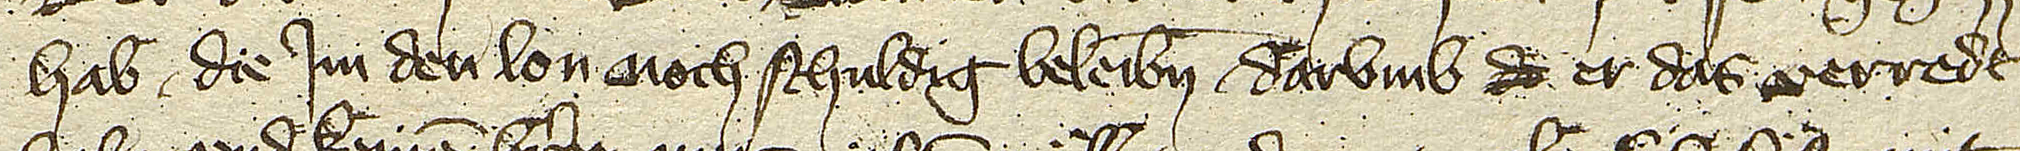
hab / die Im den lon noch ſchuldig beleibn* / darvmb d er das verredt
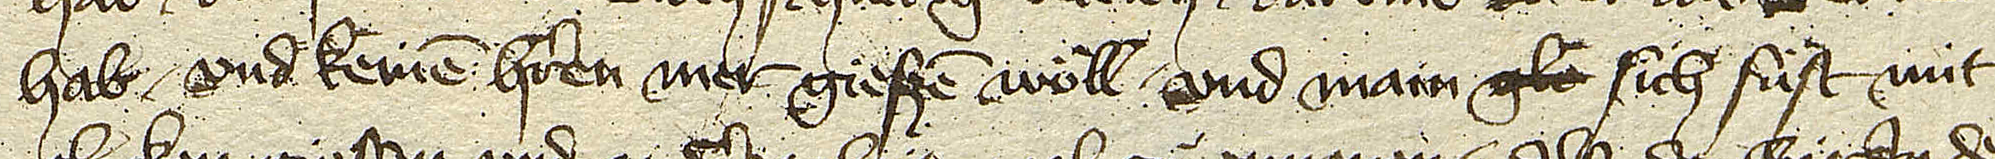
hab / vnd keine* hr*en mer gieſʒe* wöll / vnd main gle ſich ſüſt mit
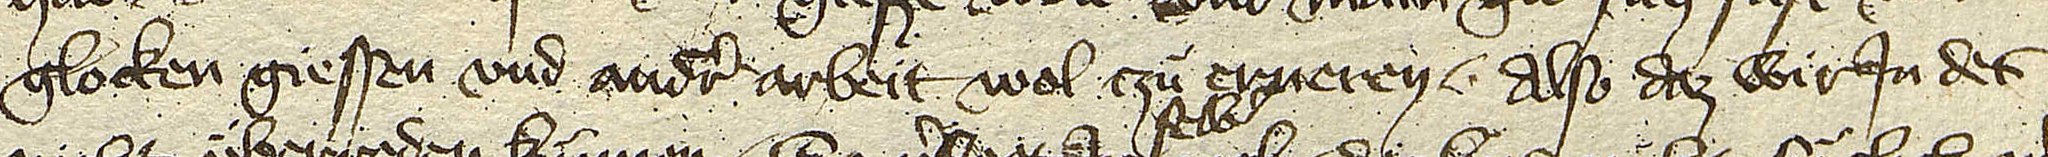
glocken gieſſen vnd andr* arbeit wol cʒü erneren / . Alſo daʒ wir In des
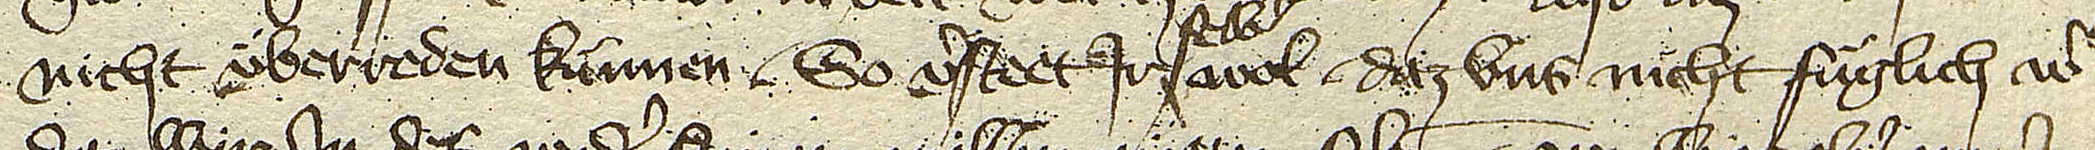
nicht v̈berreden künnen / So v*ſteet Ir wol / daʒ vns nicht füglich w*
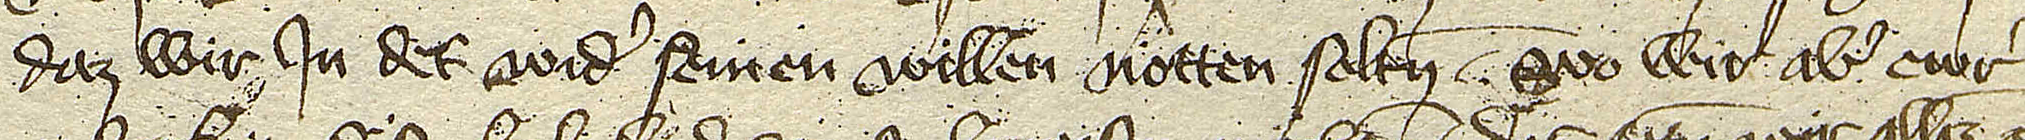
daʒ wir In des wid* ſeinen willen nötten ſoltn* / wo wir ab* ewr*
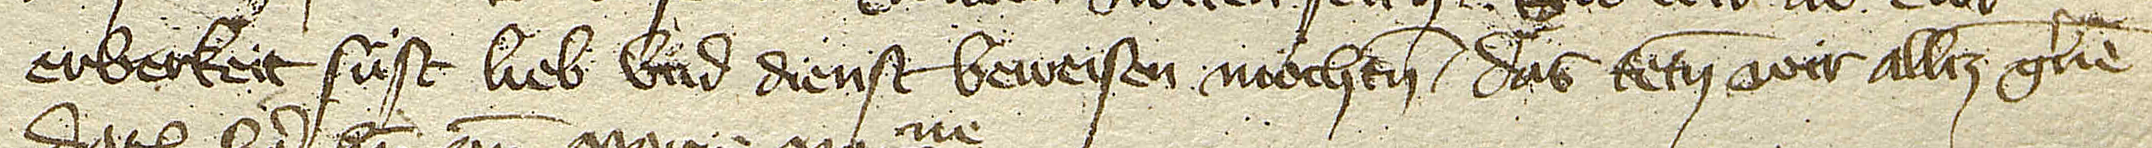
erberkeit ſüſt lieb vnd dienſt beweiſen möchtn* / das tetn* wir allcʒ* g*ne
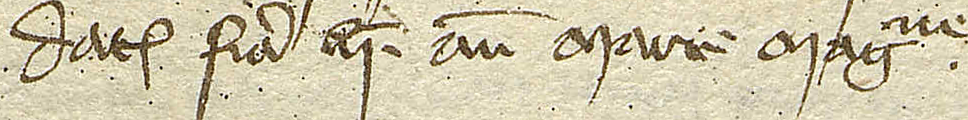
Dat* fia* iii* . an* Marie Mag* .
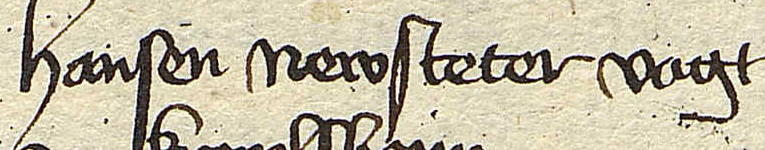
hanſen Newſteter vogt
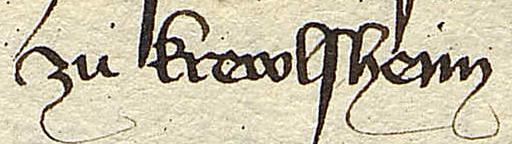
cʒu krewlſheim
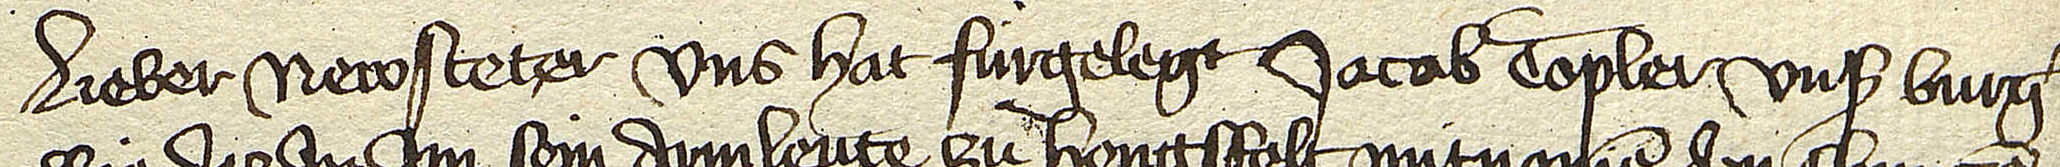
Lieber Newſteter vns hat fürgelegt Iacob Topler vnſ* burg*
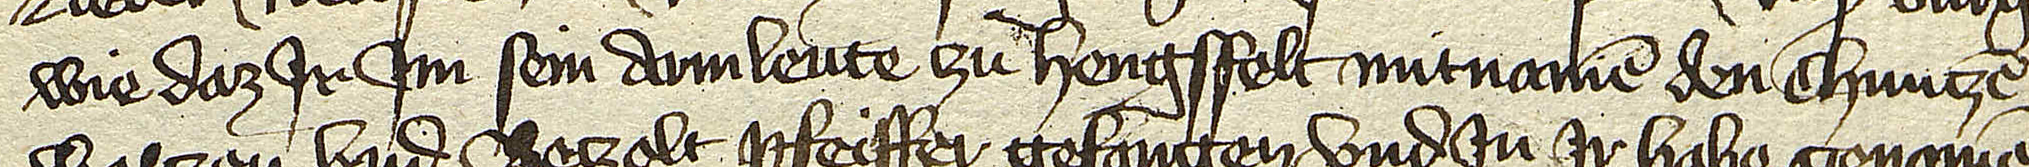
wie daʒ Ir Im ſein Armleute cʒu hengſfelt mitname* den Chuncʒe*
